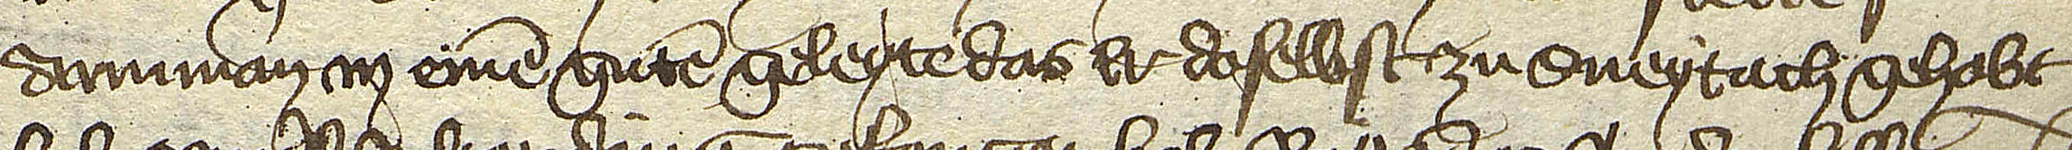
Armman in eine* gute* geleyte das Er doſelbſt cʒu Sneytach gehabt
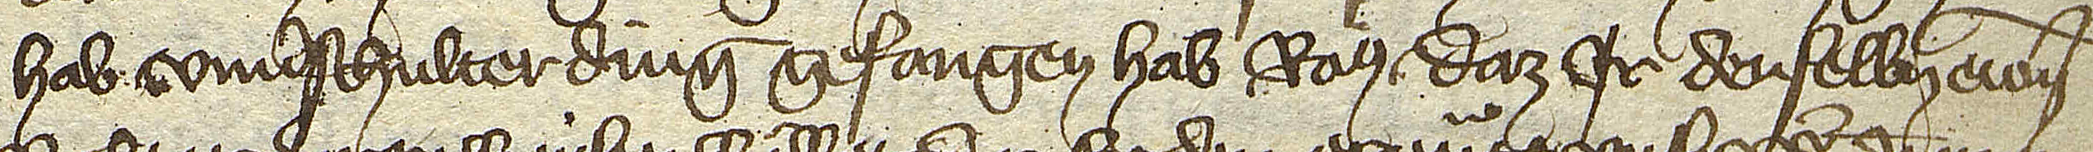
hab vnu*ſchulter ding gefangen hab / Ro* / daʒ Ir derſelbn* ewn*
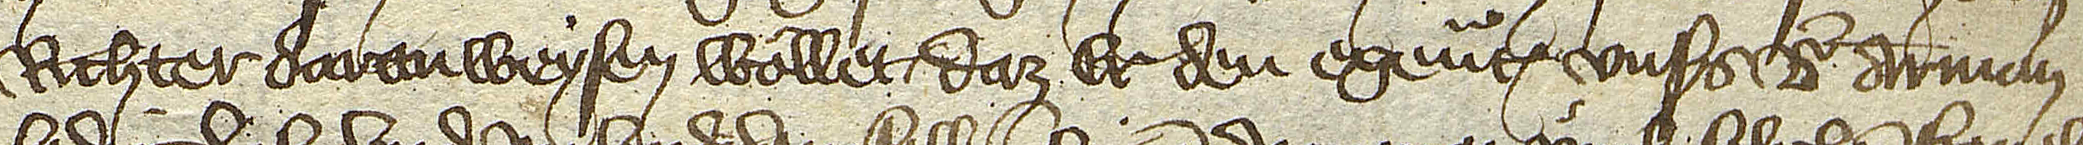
Richter daran weyſen wöllet / daʒ Er den egent* vnſ*s B* Arman
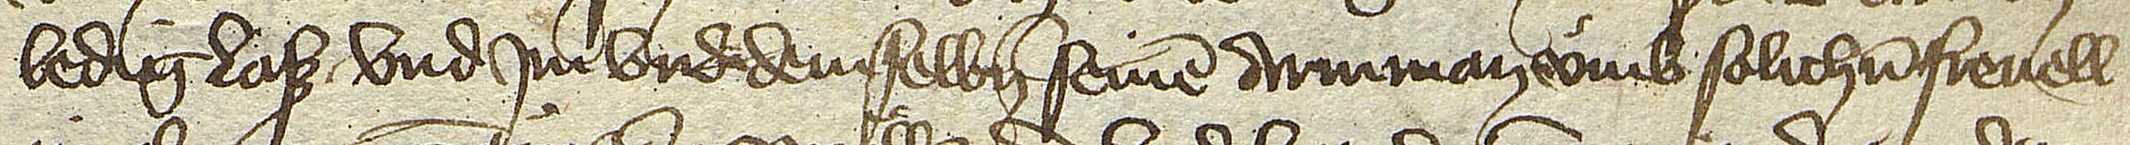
ledig laſʒ / vnd Im vnd demſelbn* ſeine* Armman v̈mb ſolichn* freuell
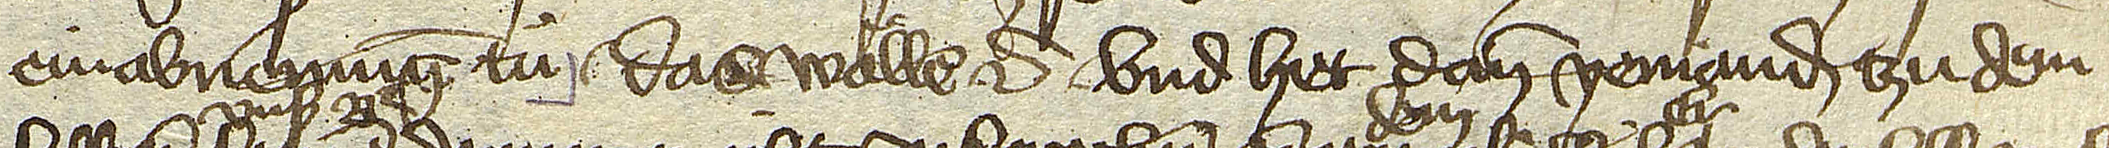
ein abnemug* tü / Das wölle* ec* / vnd het dan* yemand* cʒu dem
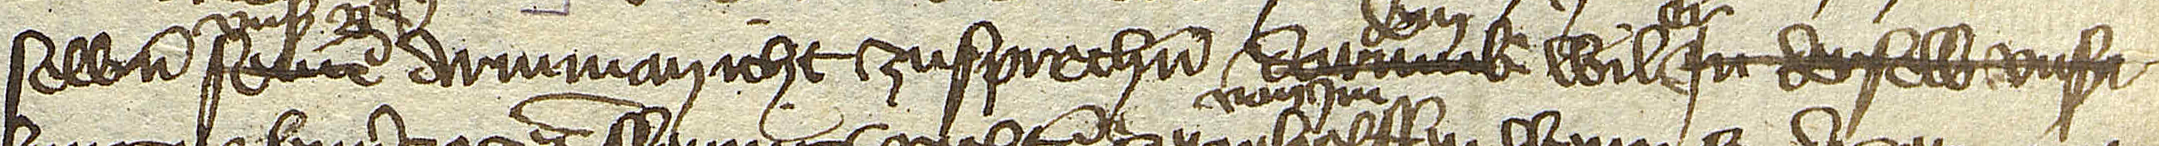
ſelbn* ſeine* Armman icht cʒuſprechn* / darumb wil In derſelb vnſ*r
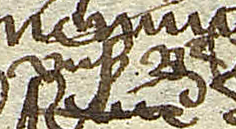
vnſ* B*
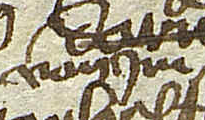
von Im
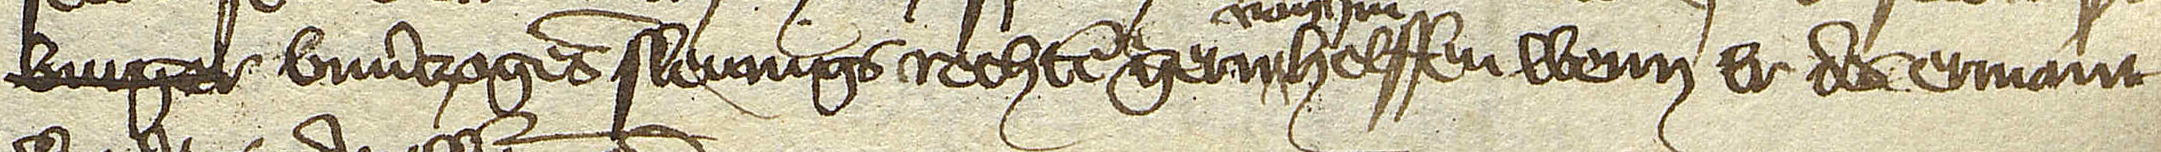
burger vnu*cʒoges* ſlewnigs rechte* gern helffen wenn Er des ermant
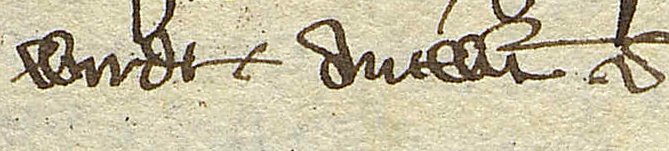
wirdt / Antwt* ec*
